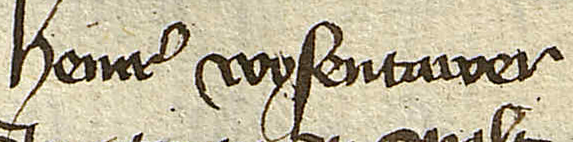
Heinr* wyſentawer
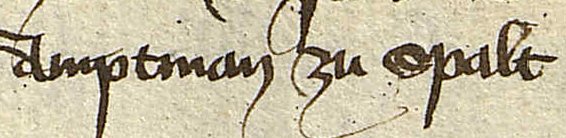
Amptman cʒu Spalt
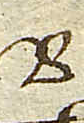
B
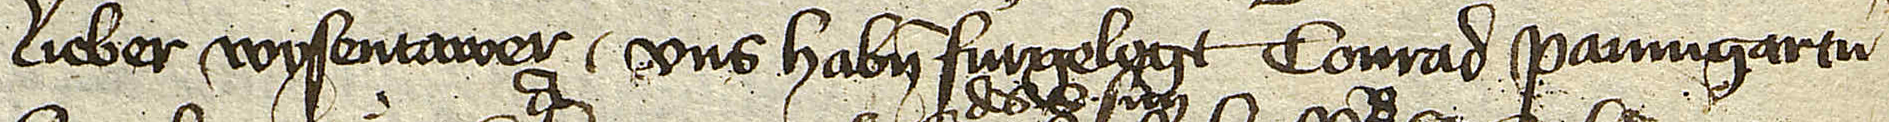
Lieber wyſentawer / vns habn* fürgelegt Conrad paumgartn*
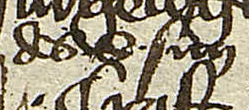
des S ſun
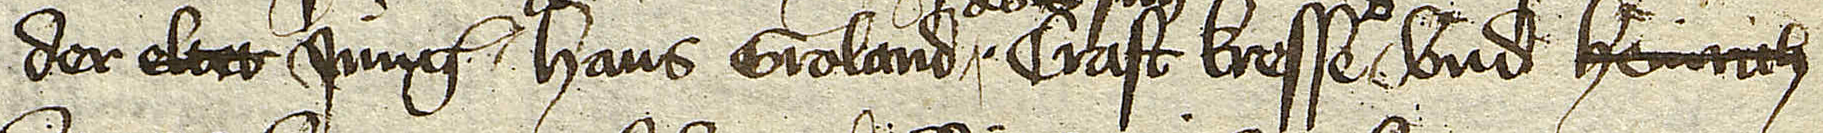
der elter Iüng* / Hans Groland . Craft kreſſe / vnd Heinrich
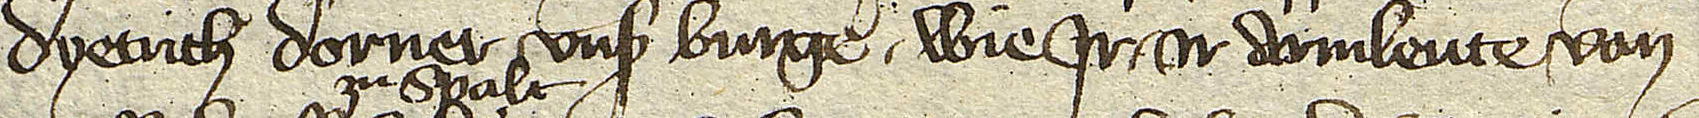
Dyetrich Dorner vnſ* burge* / wie Ir / ir Armleute von
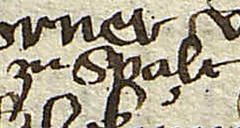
ʒu Spalt
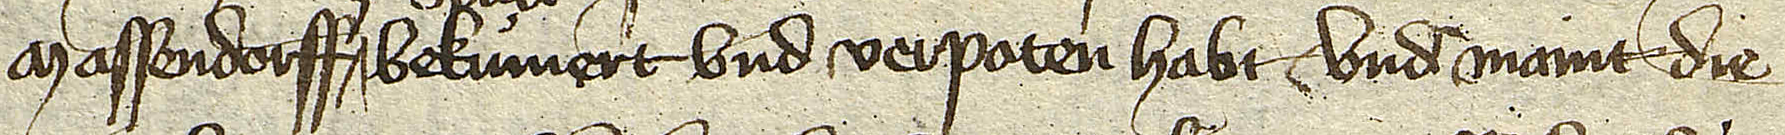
Maſſendorff bekümert vnd verpoten habt / vnd maint die
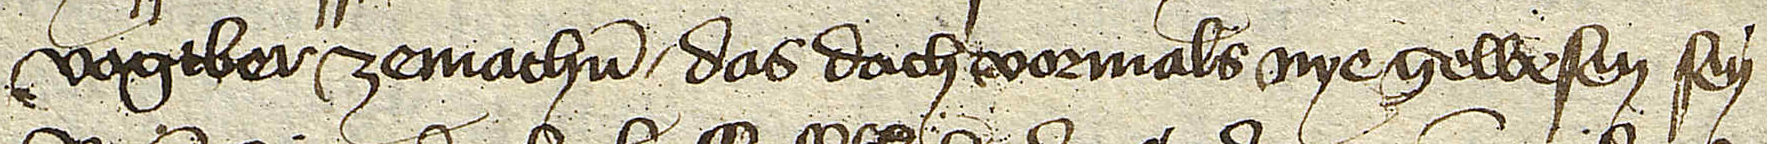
vogtber cʒemachn* / das doch vormals nye geweſen ſey
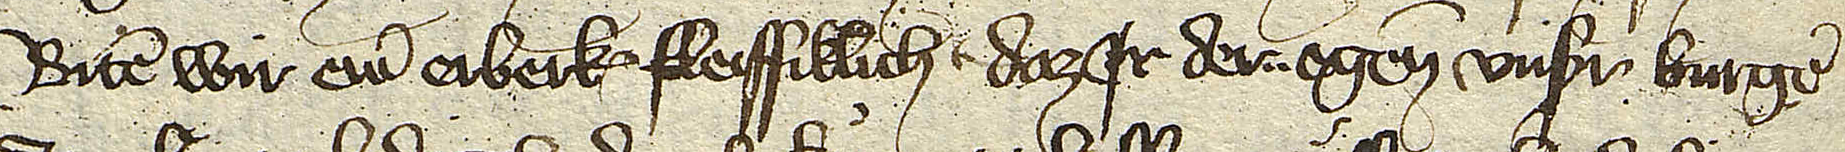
Bite* wir ew* erberk* fleiſſiklich / daʒ Ir der ~ egen* vnſ*r burge*
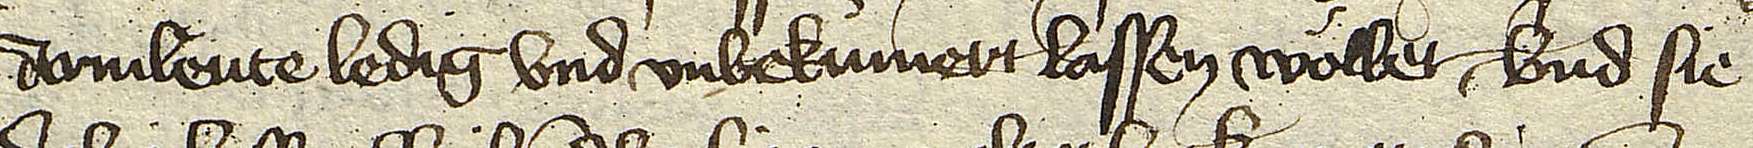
Armleute ledig vnd vnbekümert laſſen wöllet / vnd ſie
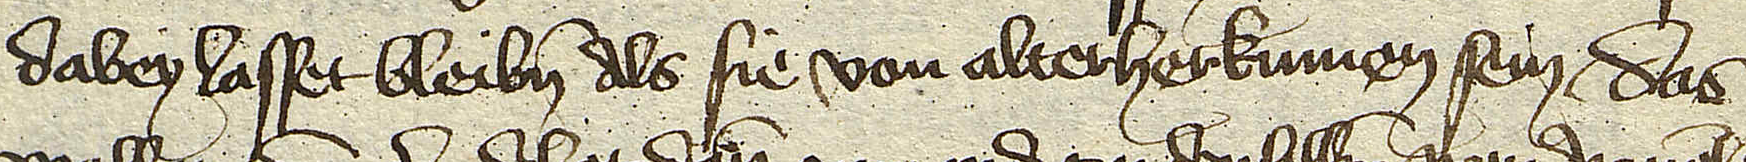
dabey laſſet bleibn* Als ſie von alterherkumen ſein / Das
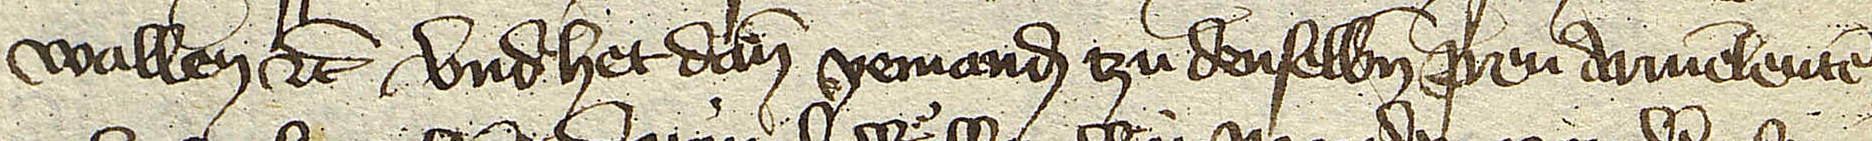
wollen ec* / vnd het dan* yemand cʒu denſelbn* Iren Arme*leute*
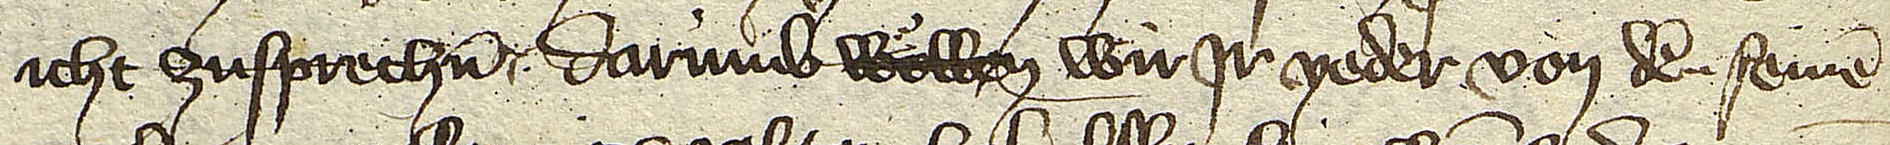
icht cʒuſprechn* / darumb wöllen wir Ir yeder von de* ~ ſeine*
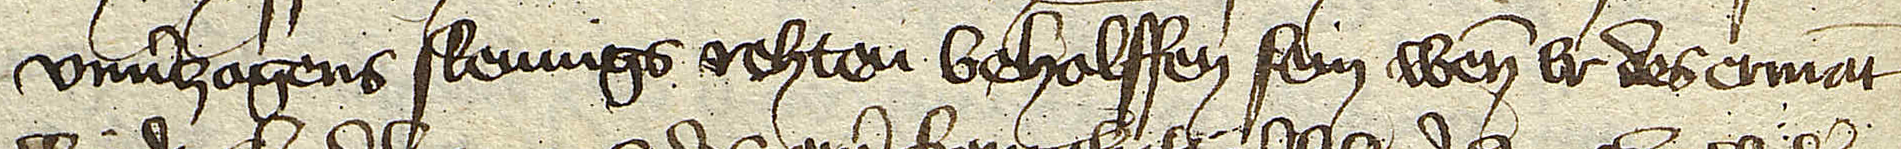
vnu*cʒogens ſlewnigs rehten beholffen ſein wen* Er des ermat*
